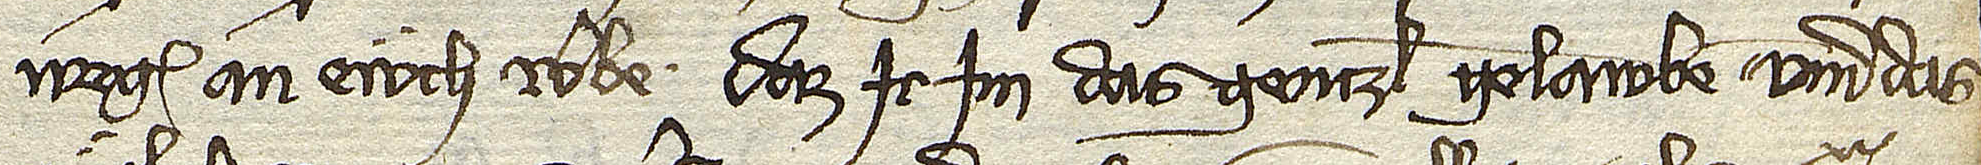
weg* an eẅch w*be . Daʒ Ir In das gencʒl* gelawbe* / vnd das
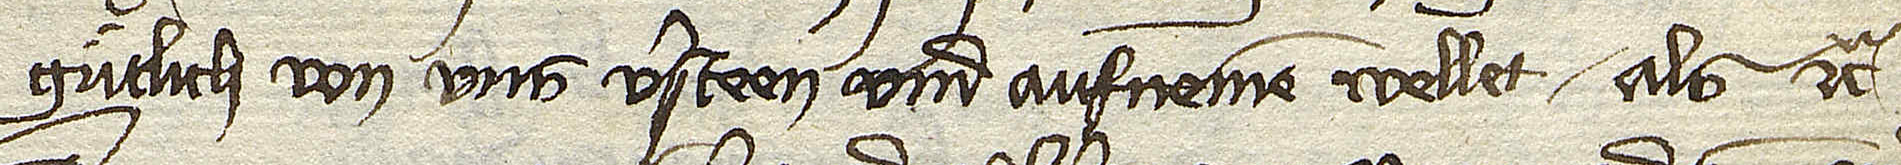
gütlich von vns v*ſteen vnd aufneme* wellet / als ec*
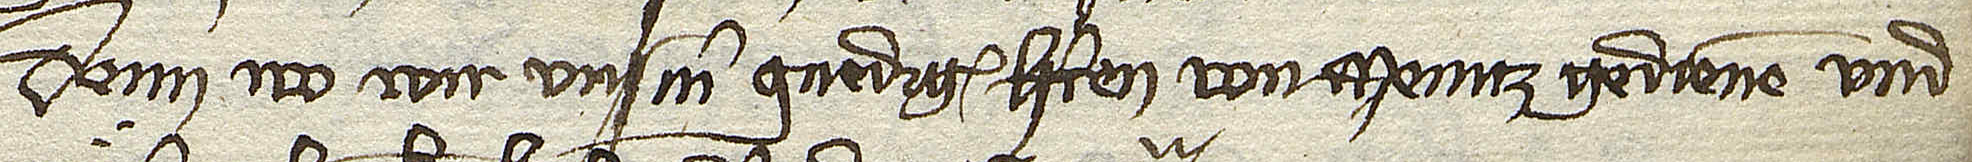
Denn wo wir vnſm* gnedig* h*ren von Meincʒ gediene* vnd
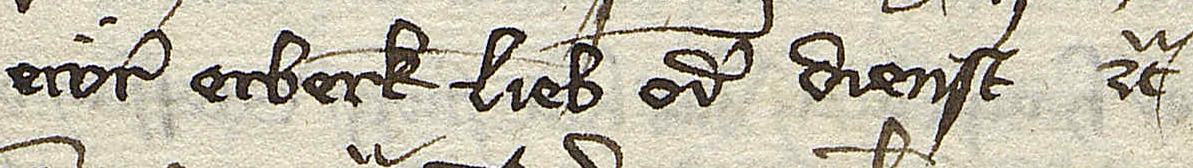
eẅr* erberk* lieb od* dienſt ec*
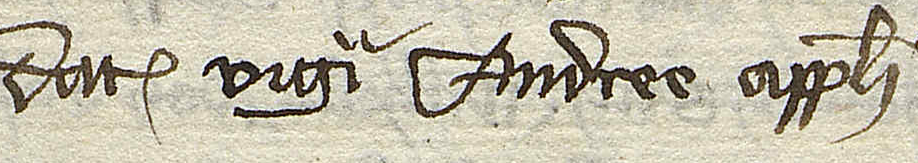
Dat* vigi* Andree appli*
